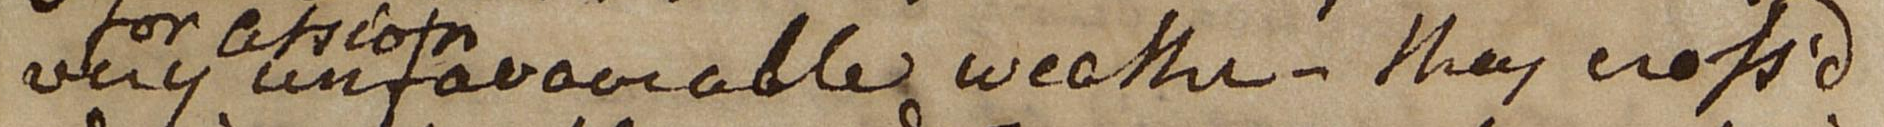very unfavourable weather- they cross'd
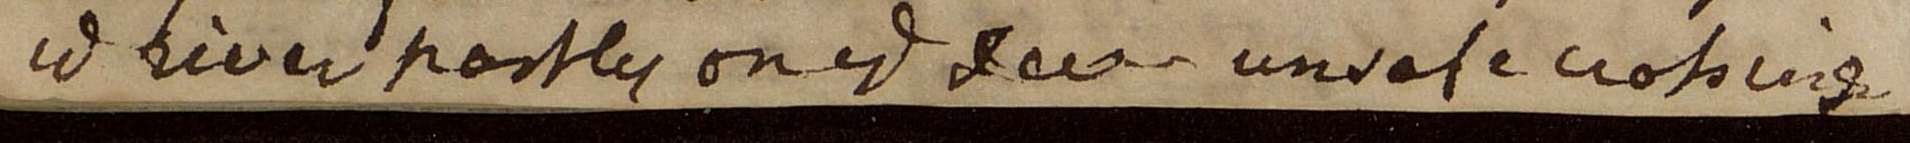y^e river partly on y^e Ice - unsafe crossing
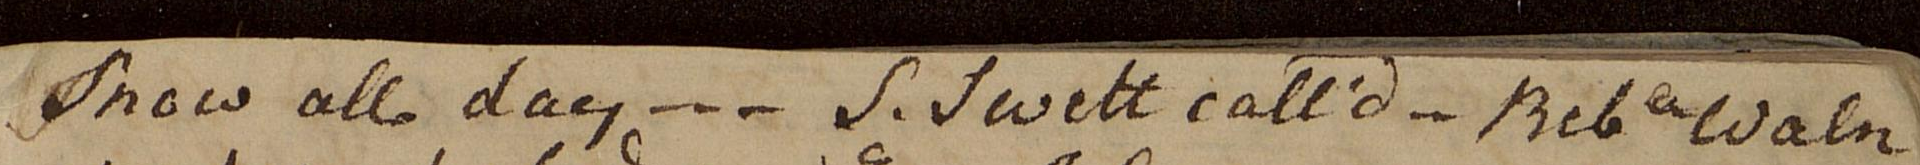Snow all day--- S. Swett call'd- Reb^a Waln
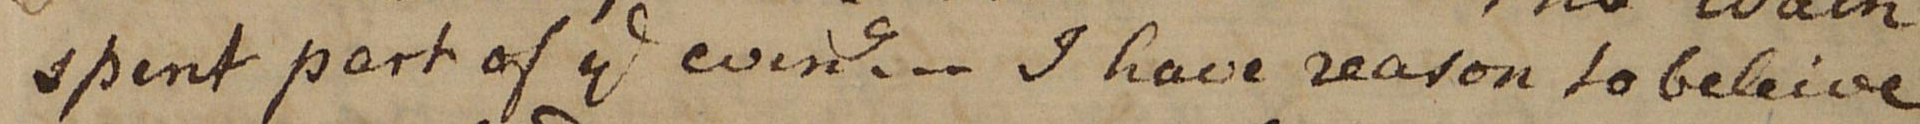spent part of y^e even^g.- I have reason to beleive
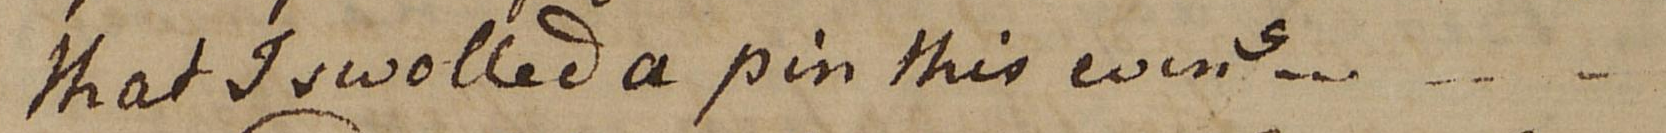that I swolled a pin this even^g--
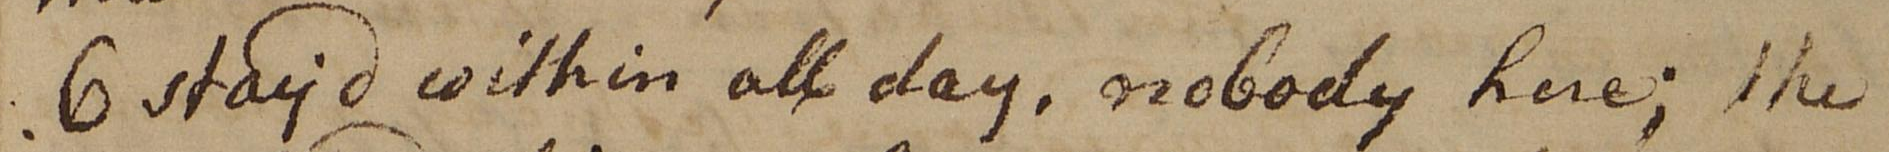6 stay'd within all day, nobody here; the
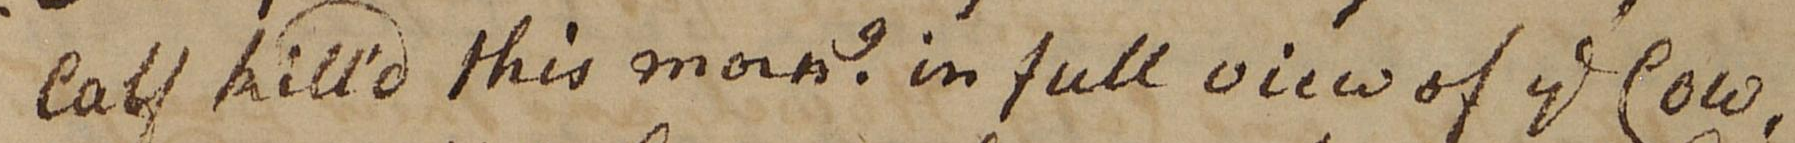Calf kill'd this morn^g. in full view of y^e Cow,
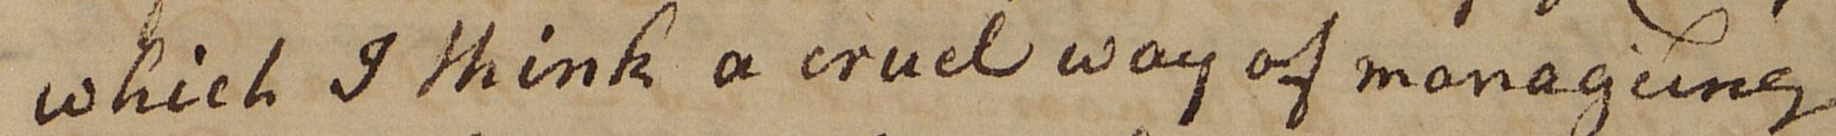which I think a cruel way of managing
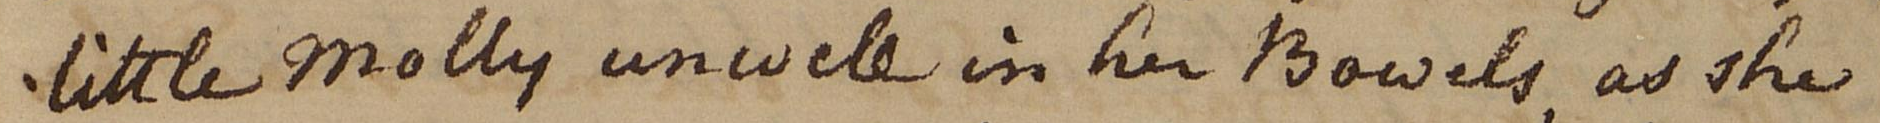little molly unwell in her Bowels, as she
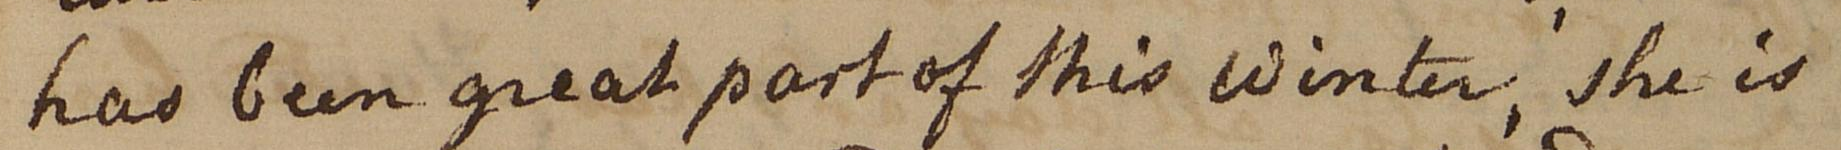has been great part of this winter, she is
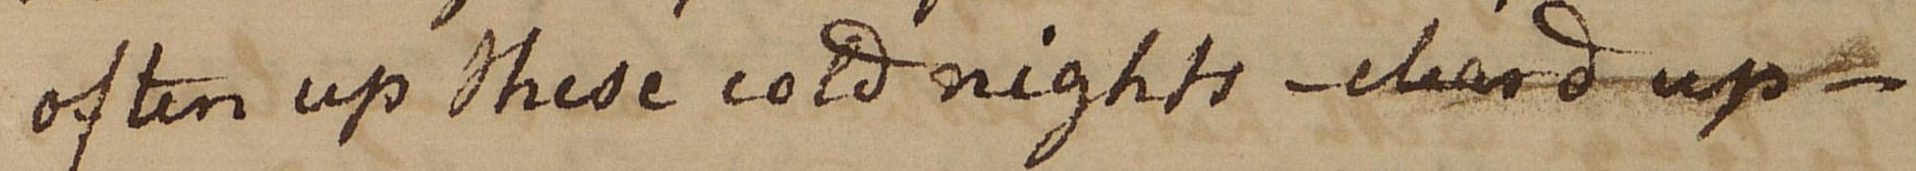often up these cold nights- cleard up-
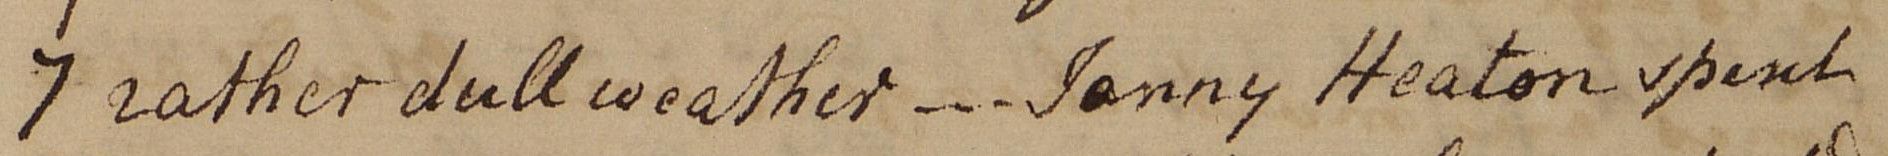7 rather dull weather-- Janny Heaton spent
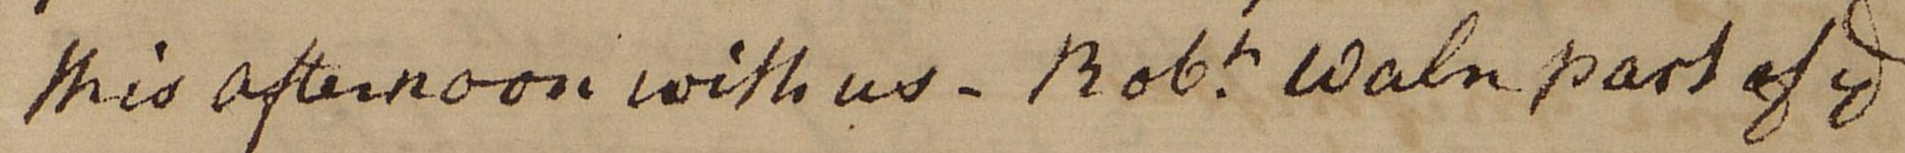this afternoon with us- Rob^t. Waln part of y^e
